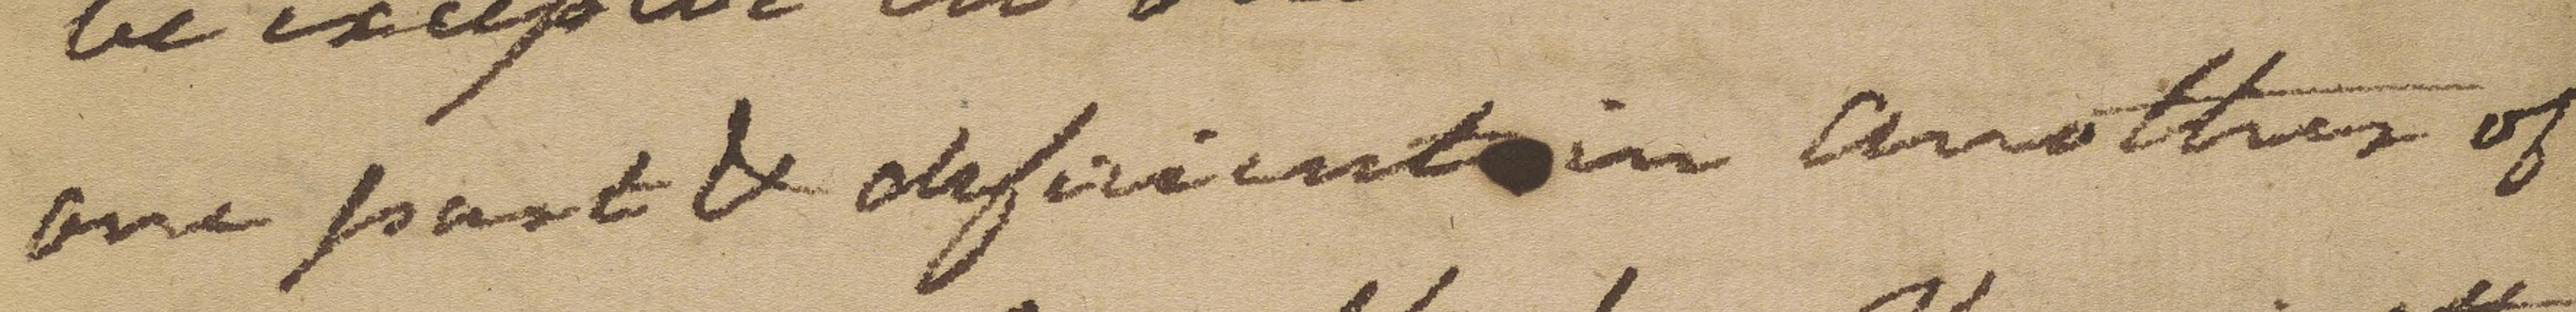are past & deficient in another of
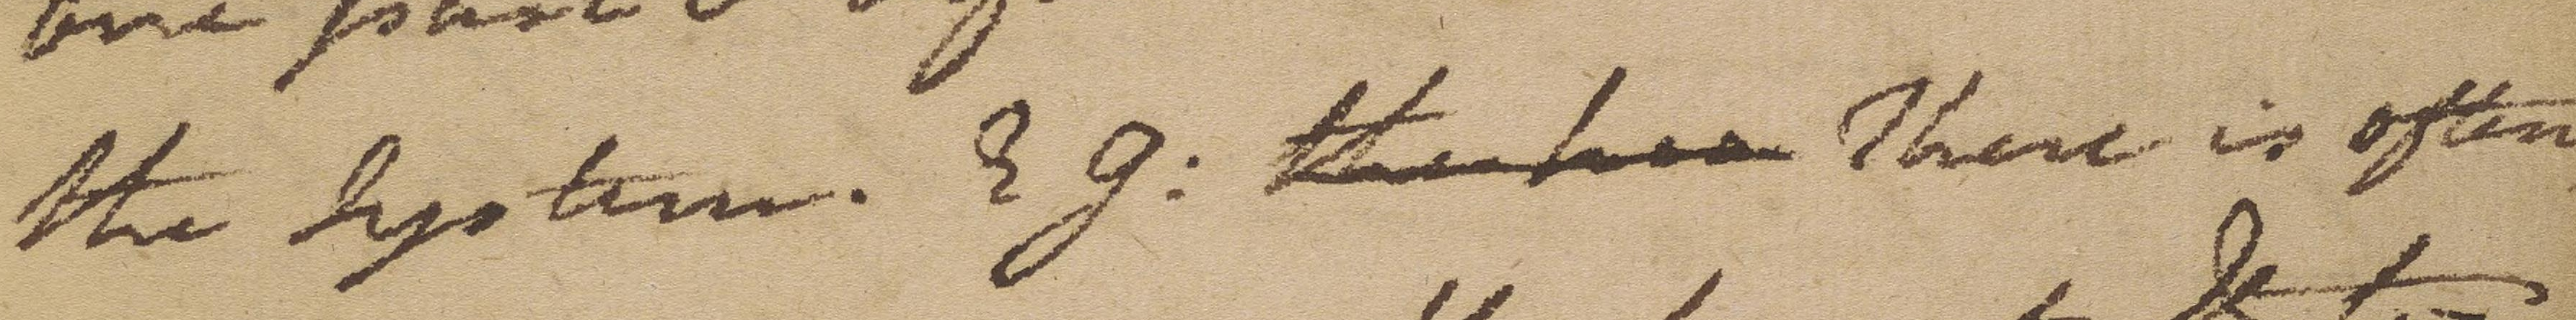the system. Eg. [the hea] There is often
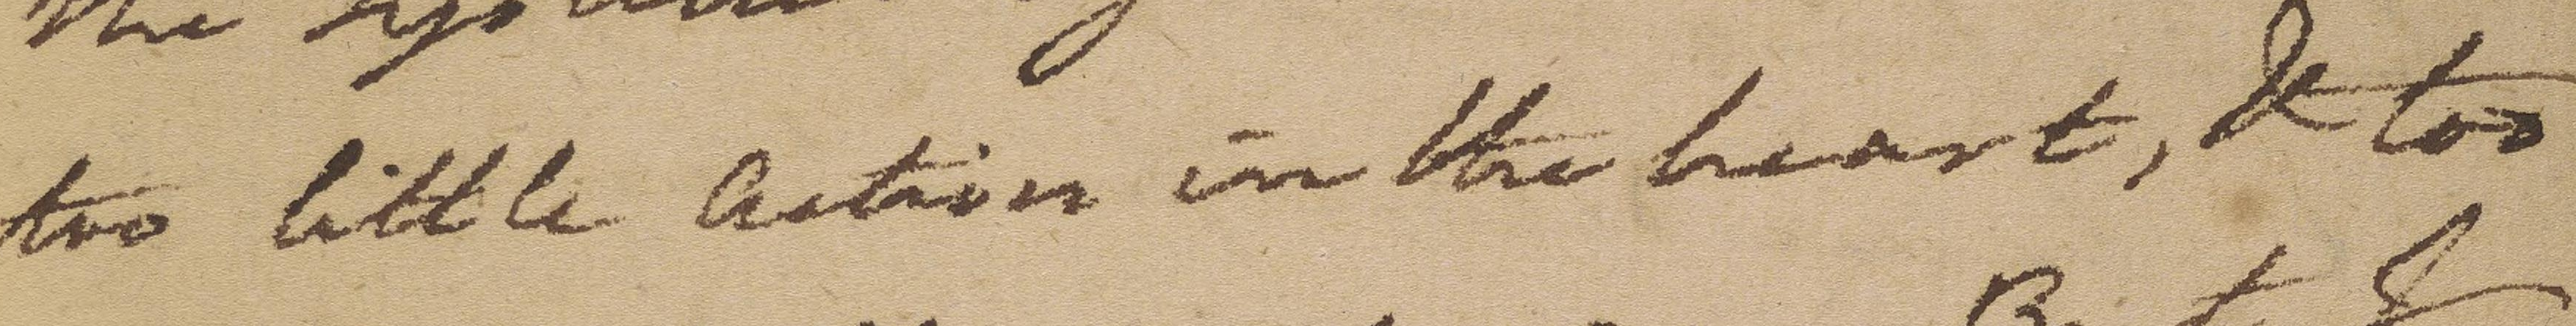two little Action in the heart, & too
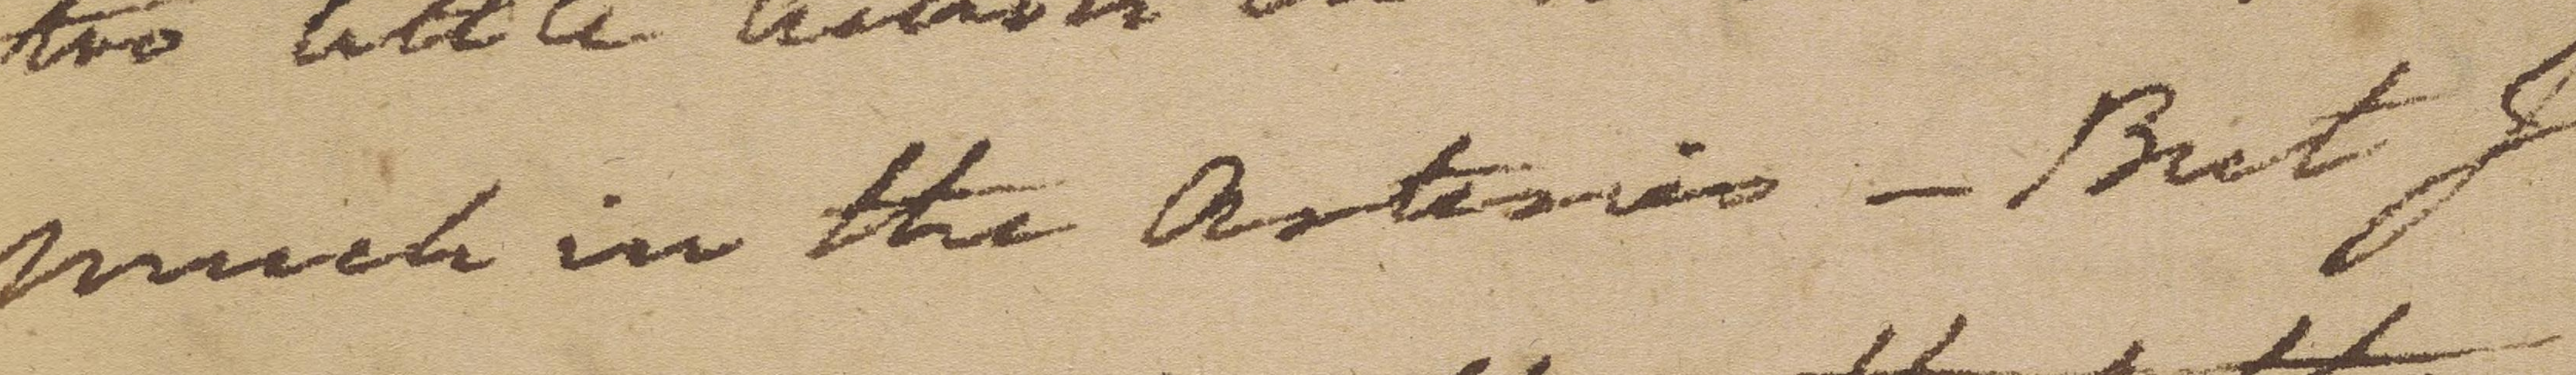much in the Arteries, But I
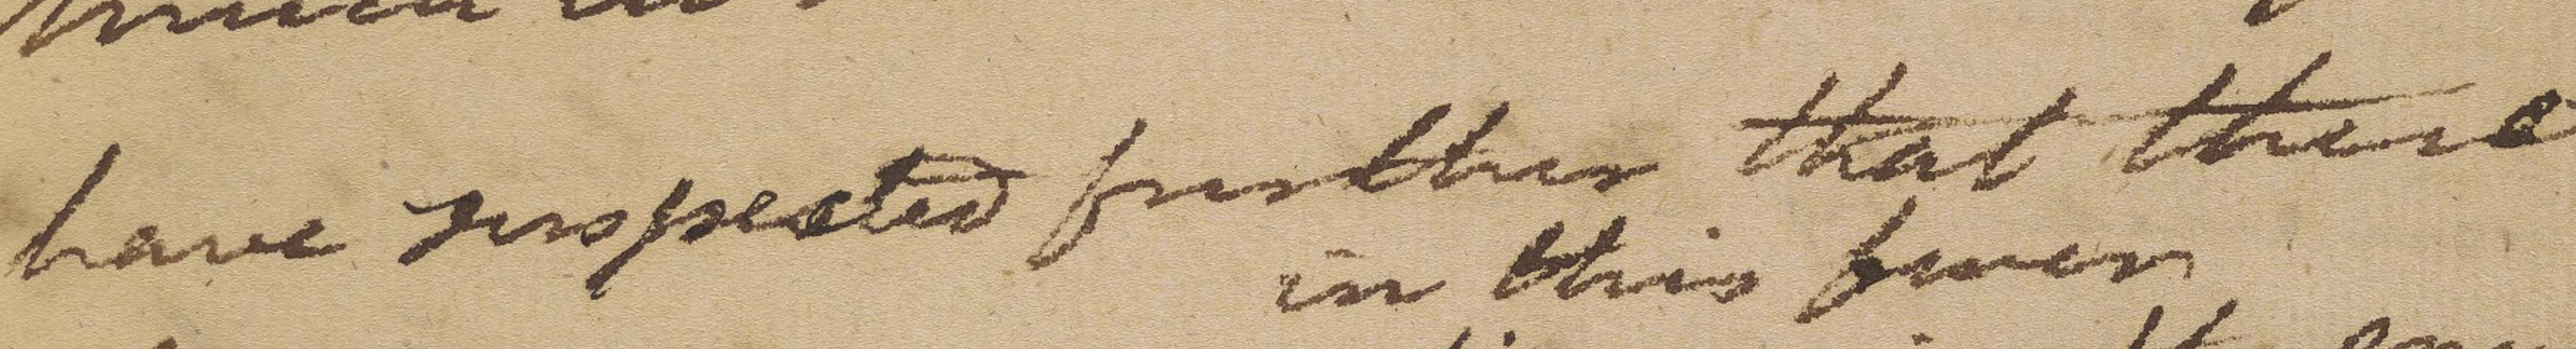have epested further that there
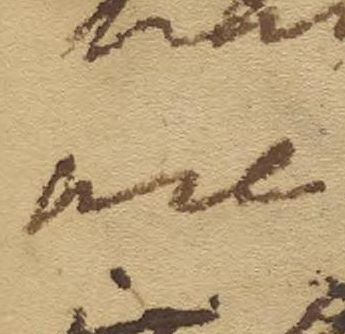are
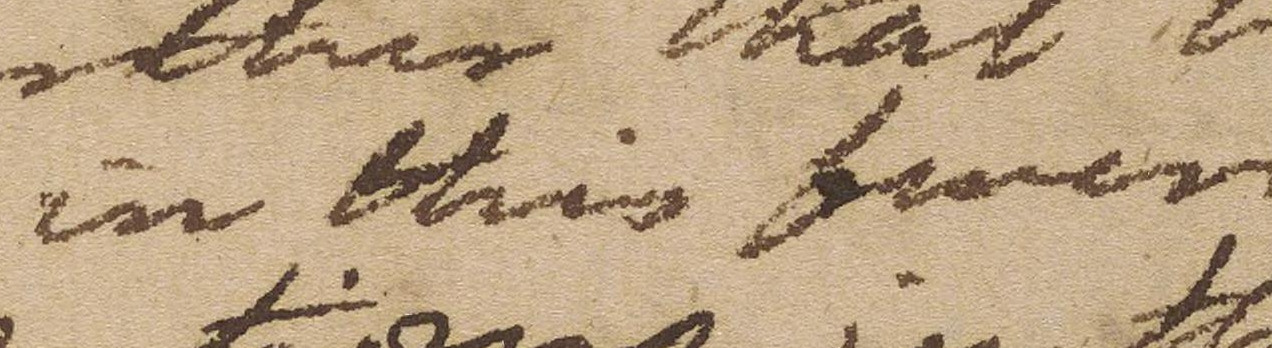in this fever
